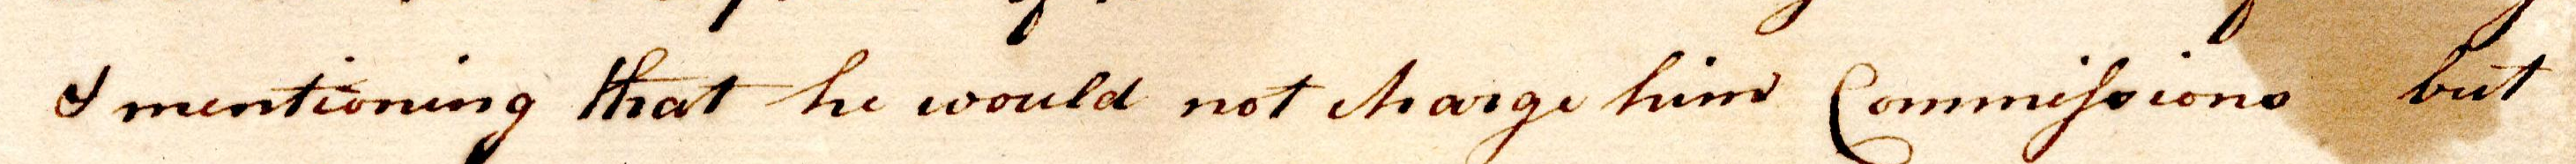& mentioning that he would not charge him Commissions but
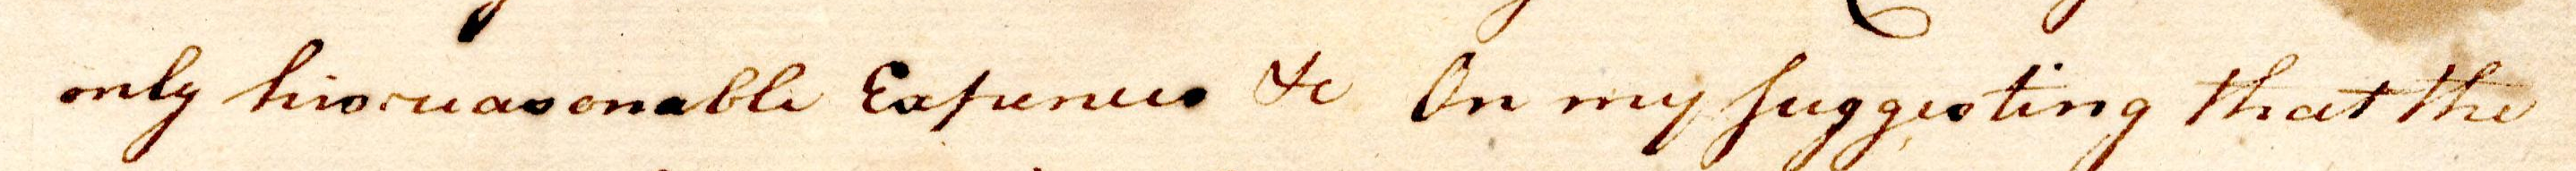only his reasonable Expences &c On my suggesting that the
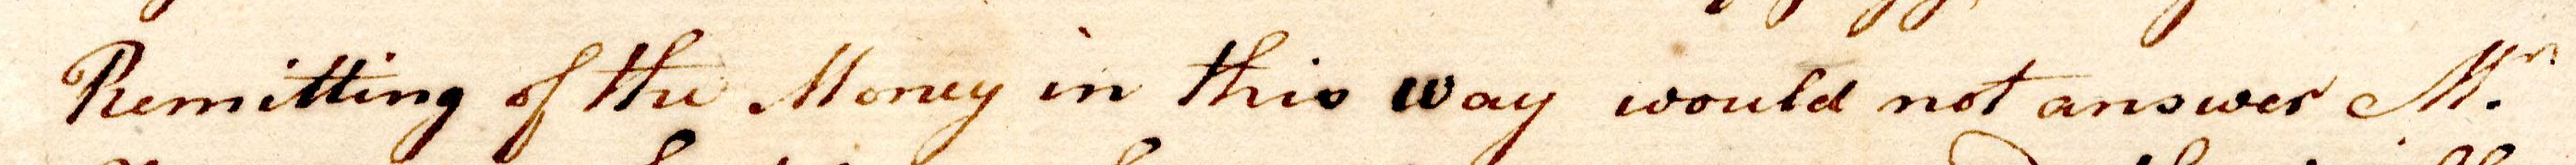Remitting of the Money in this way would not answer M^r.
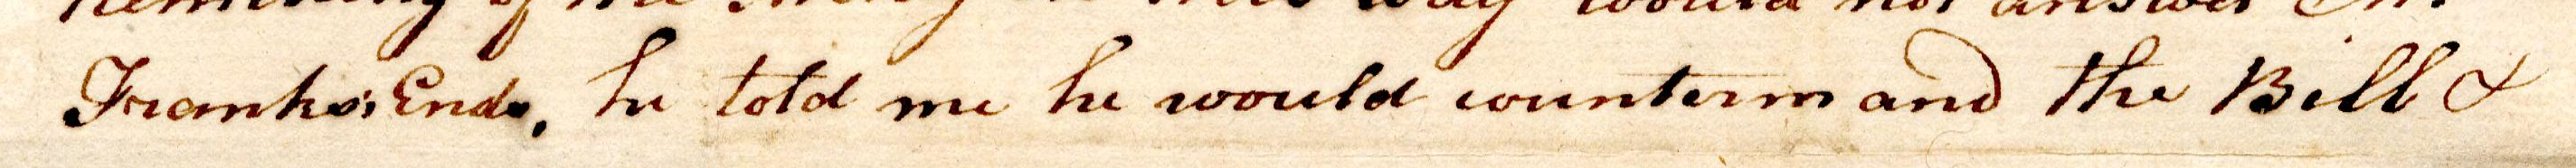Franks's Ends, he told me he would counterm and the Bill &
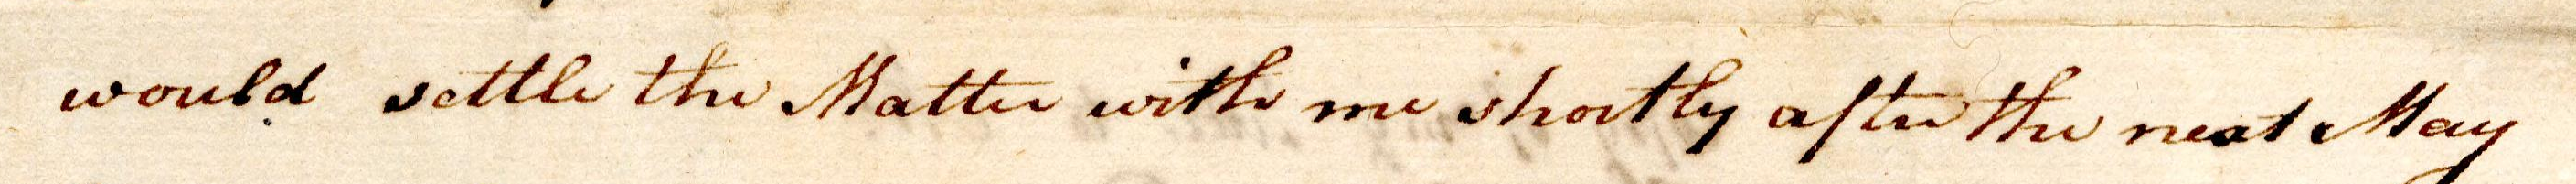would settle the Matter with me shortly after the next May
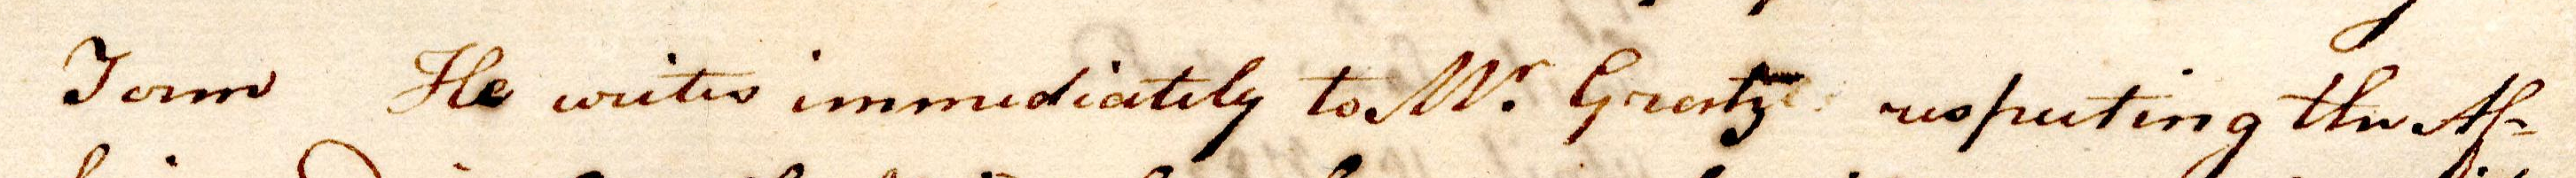Term. He writes immediately to M^r. Gratz: respecting the Af-
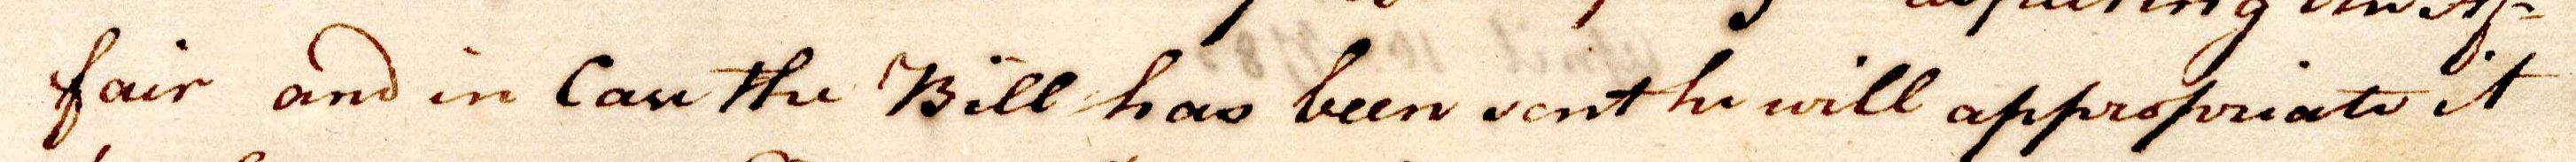-fair and in Case the Bill has been sent he will appropriate it
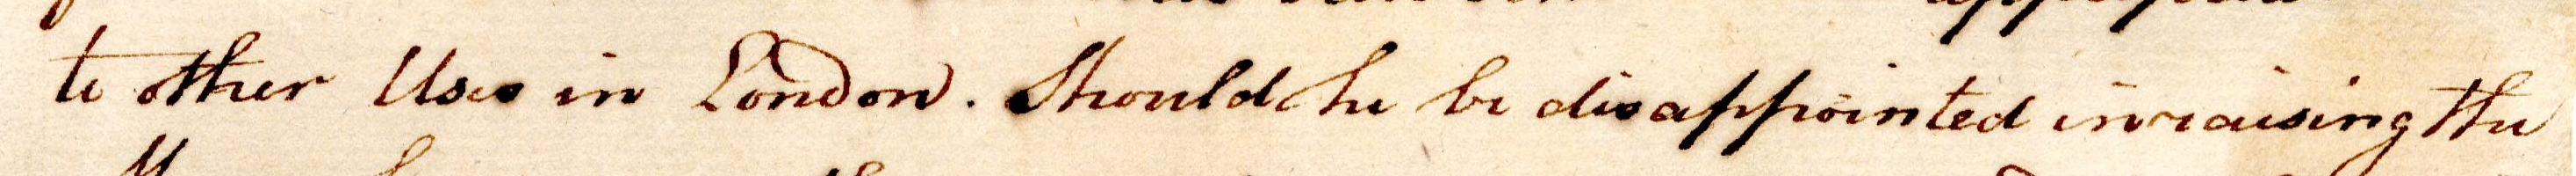to other Use in London. Should he be disappointed in raising the
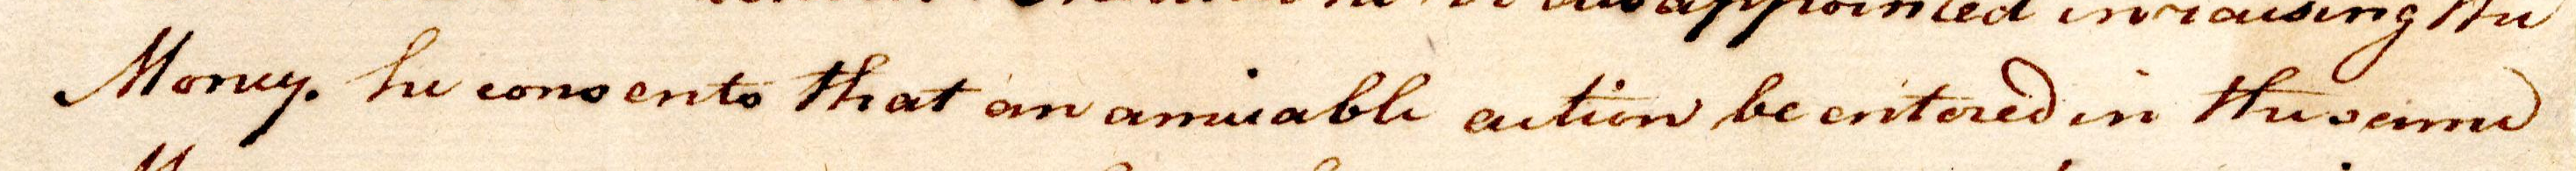Money. he consents that an amiable action be entered in the same
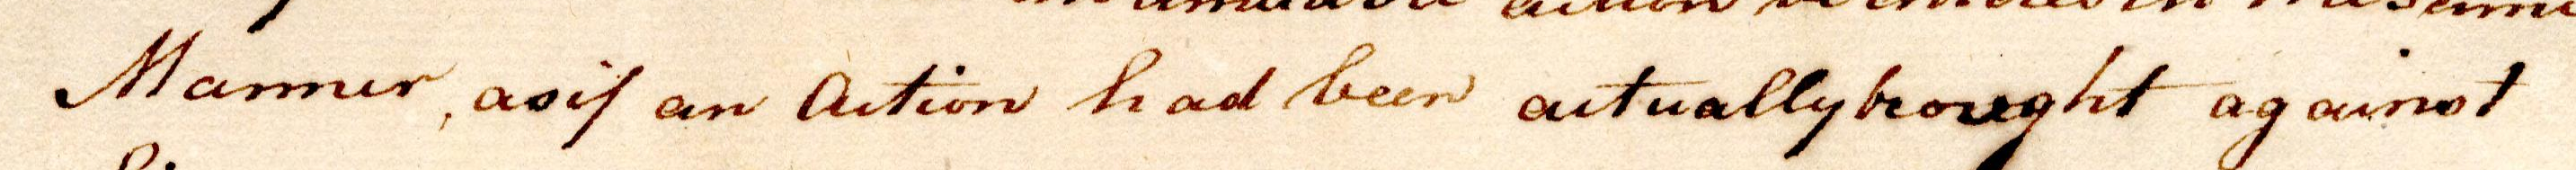Manner, as if an Action had been actually brought against
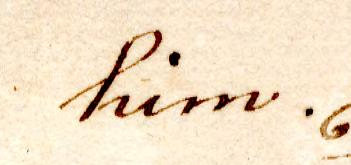him.
